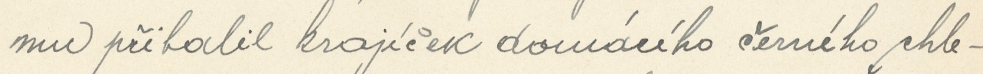mu přibalil krajíček domácího černého chle-
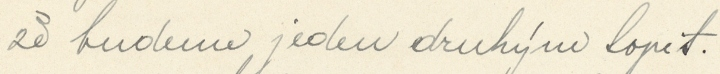že budeme jeden druhým topit.
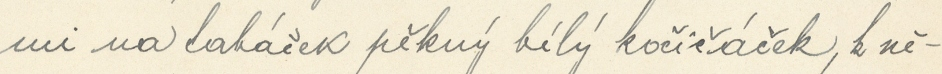mi na tabáček pěkný bílý kočičáček, k ně-
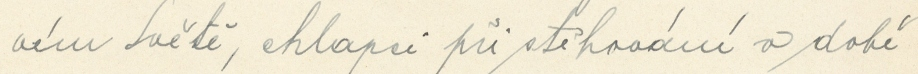vém Světě, chlapci při stěhování v době
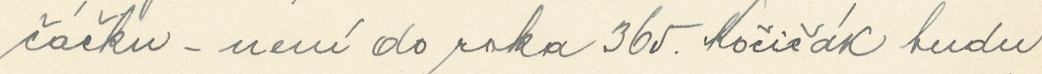čáčku - není do roka 365. Kočičák budu
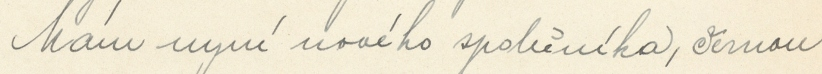Mám nyní nového společníka, černou
